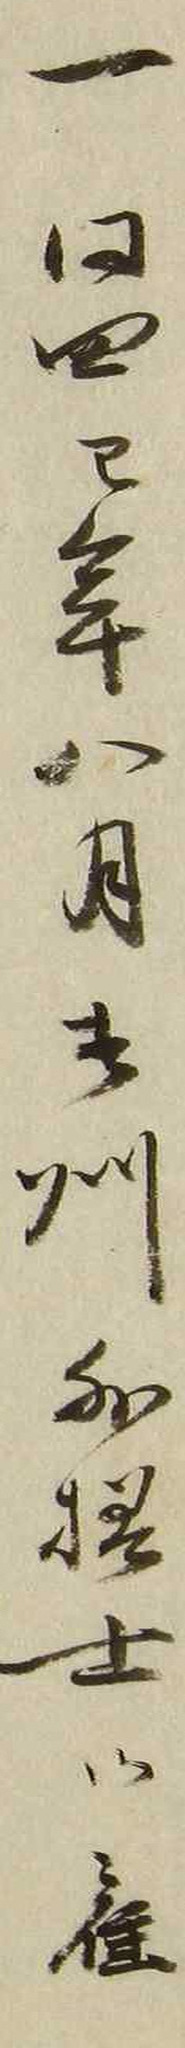一同四巳年八月相州外様士御雇
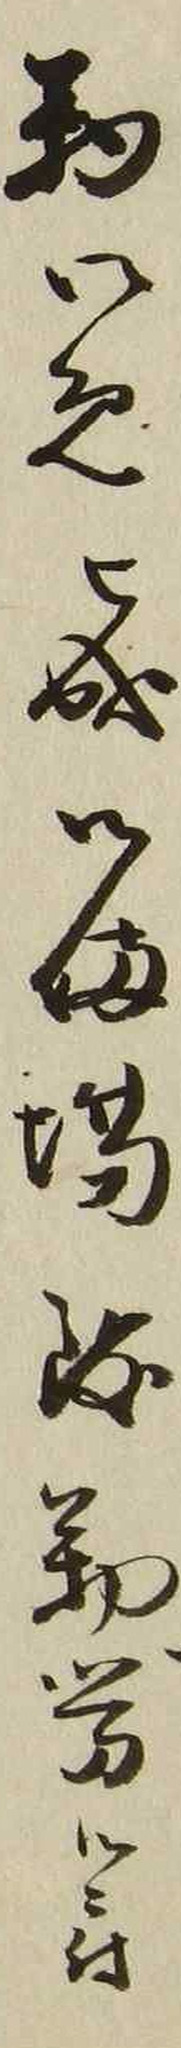勤御免被成御備場致勤労候ニ付
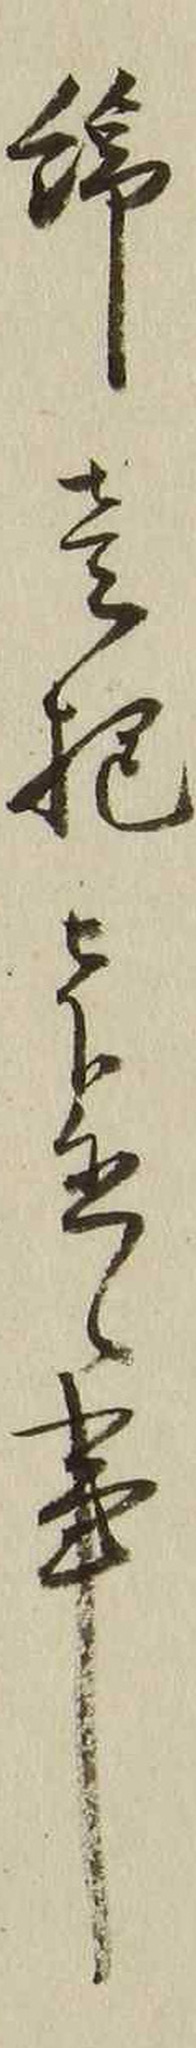綿壱把被下置候事
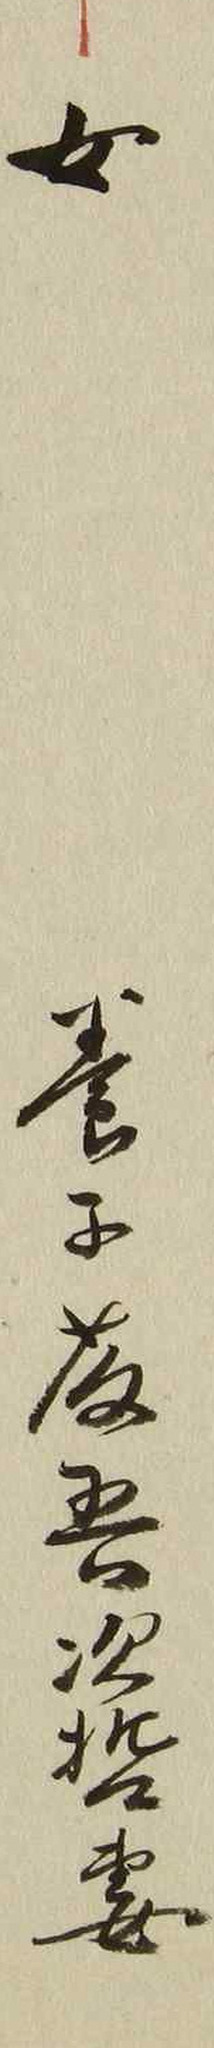女養子藤吾次哲妻
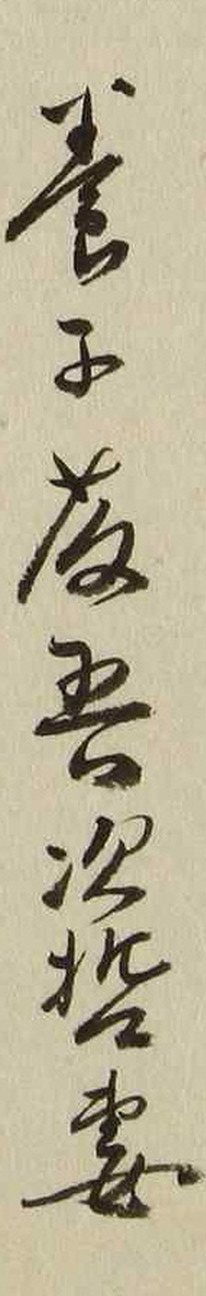女養子藤吾次哲妻
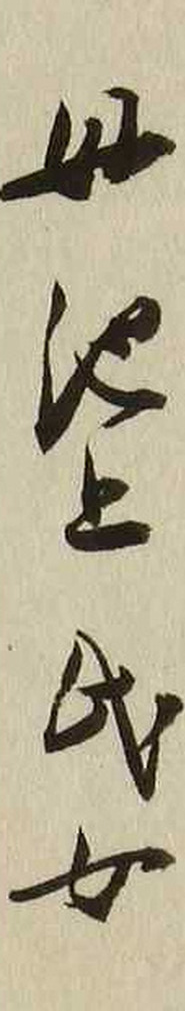母池上氏女
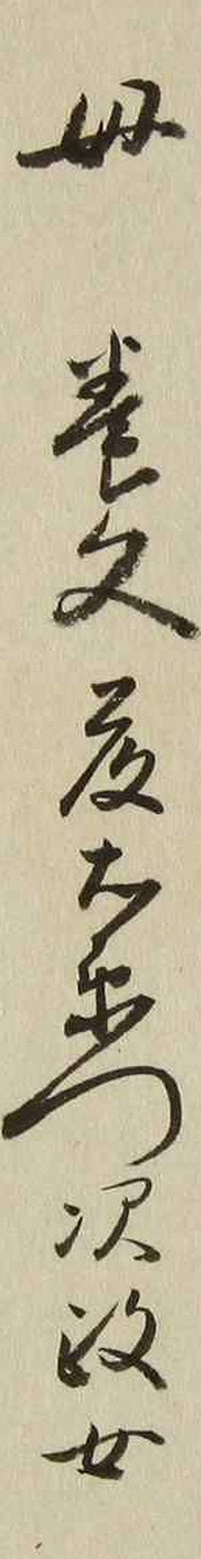母養父藤右衛門次政女

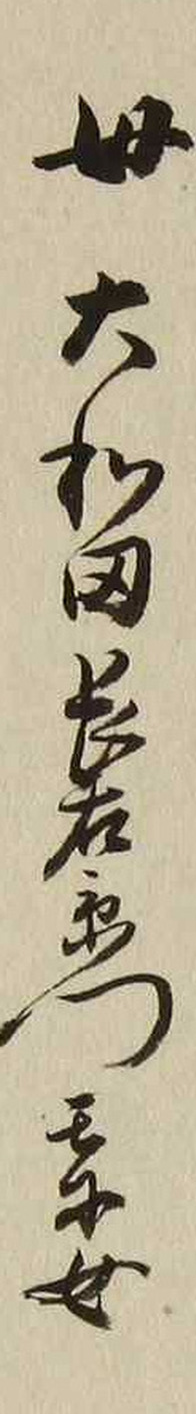母大和田長右衛門某女
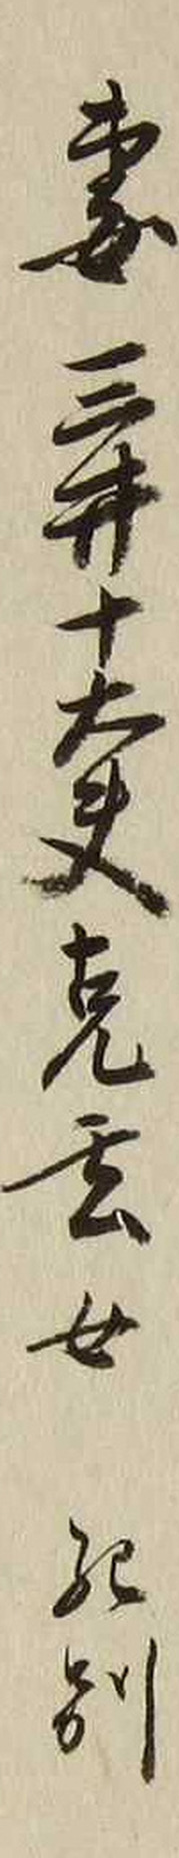妻三井十太夫克玄女死別
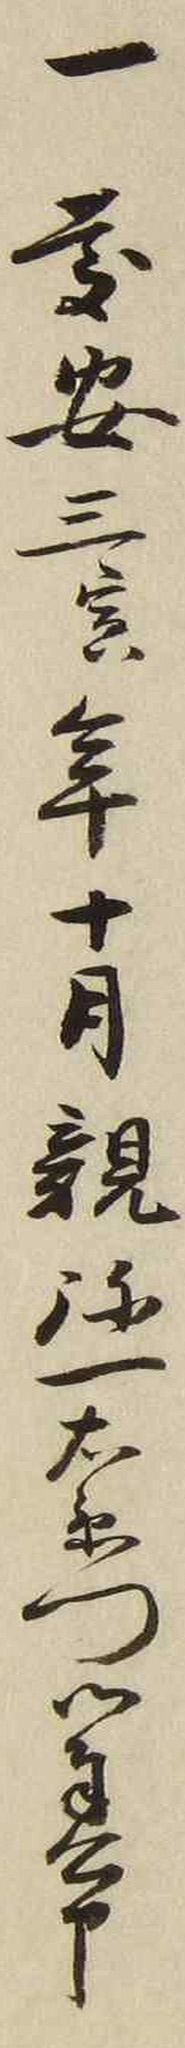一慶安三寅年十月親弥一右衛門御奉公申

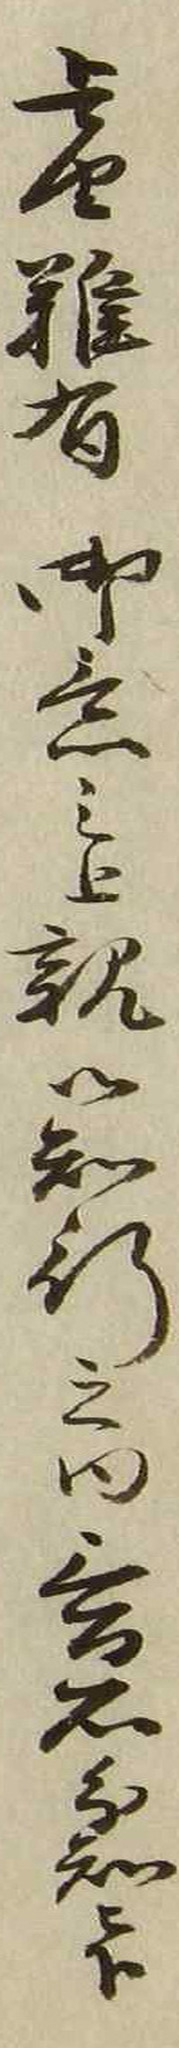上候由難有御意之上親御知行之内三百石分知被下
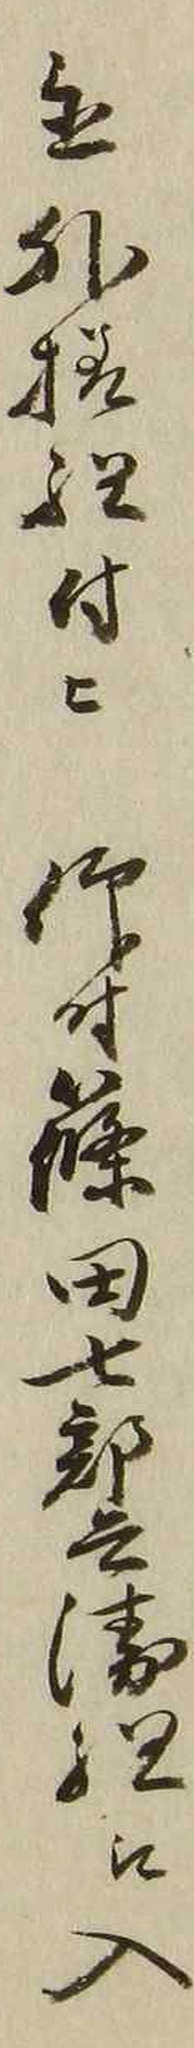置外様組付被仰付篠田七郎兵衛組江入
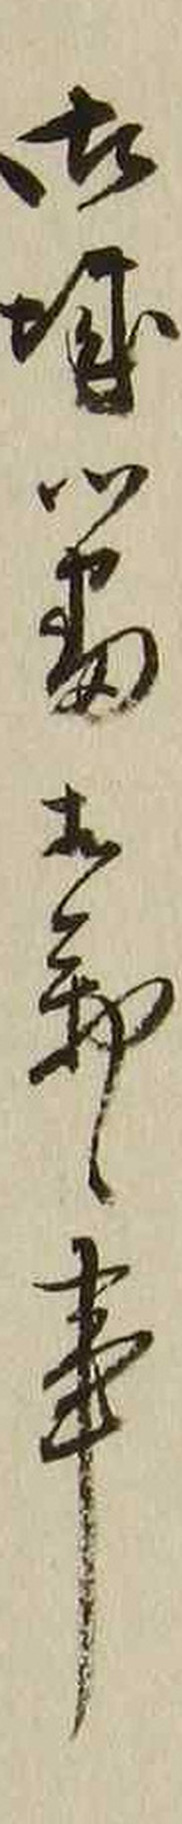御城御番相勤候事
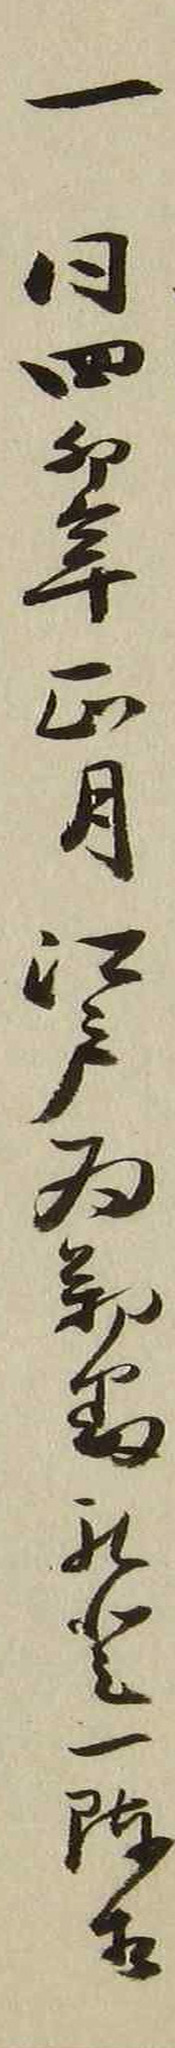一同四卯年正月江戸為勤番罷登一陣相
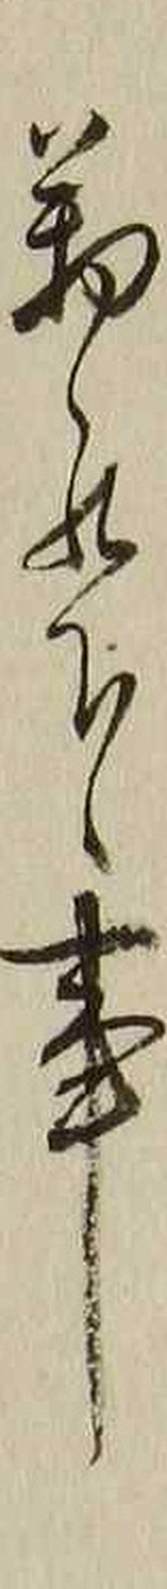勤罷下候事
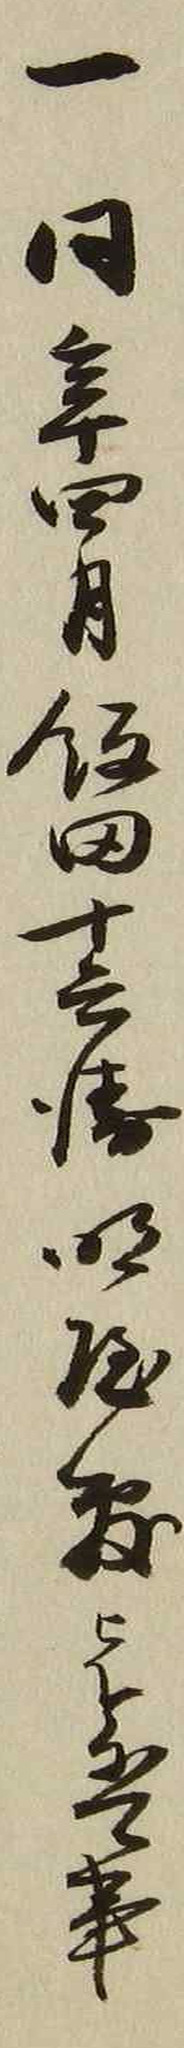一同年四月飯田十兵衛明屋敷被下置候事
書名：諸士系譜　巻之288　さ之部20
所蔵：会津若松市立会津図書館
